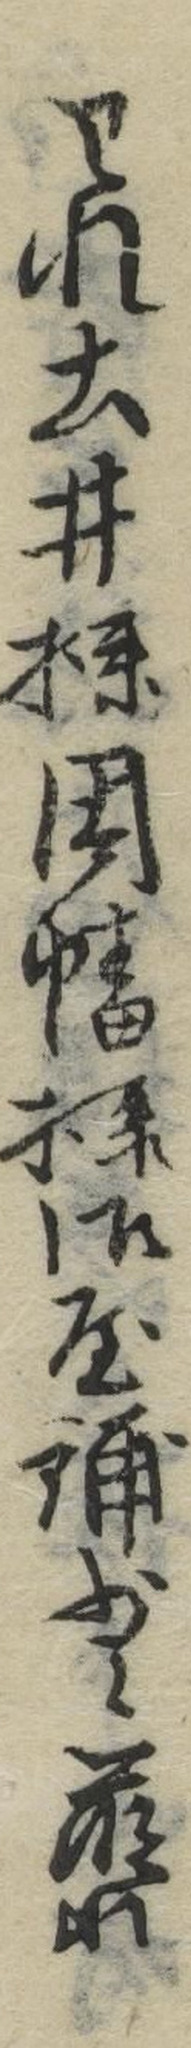われ土井様因幡様御屋鋪少〻崩れ

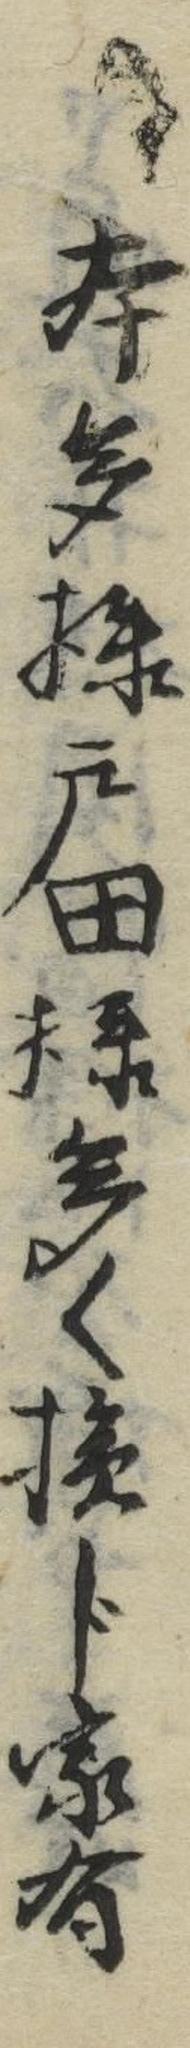本多様戸田様多く損じ家有
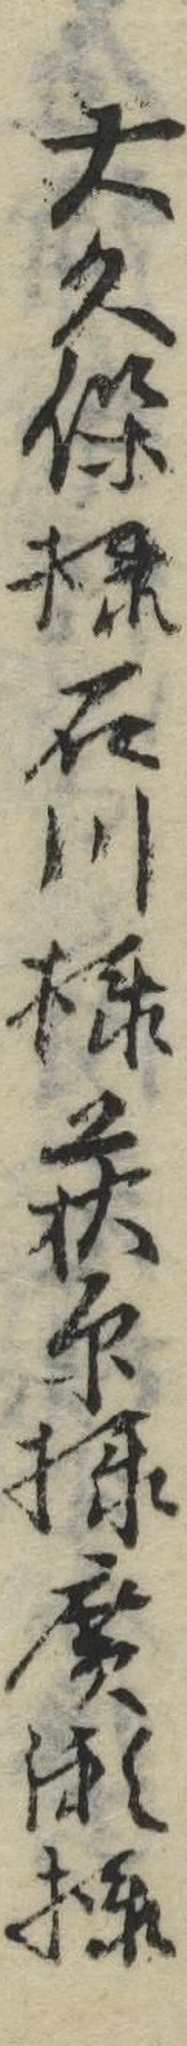大久保様石川様萩原様廣瀬様
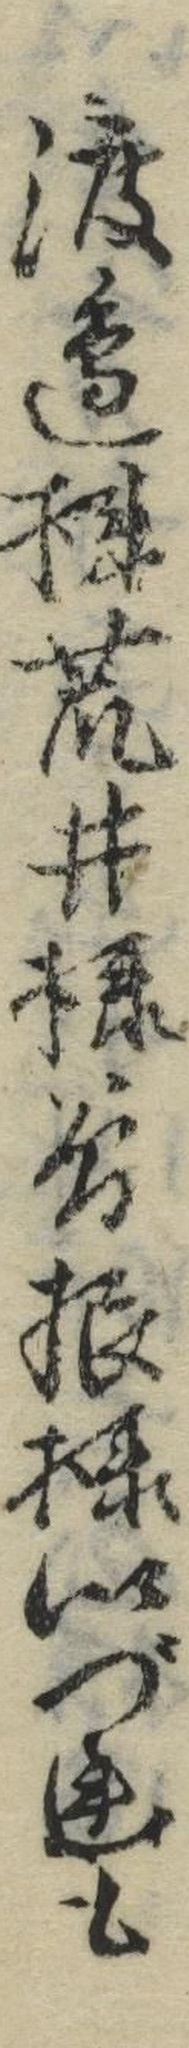渡邊様荒井様曽根様いづれも
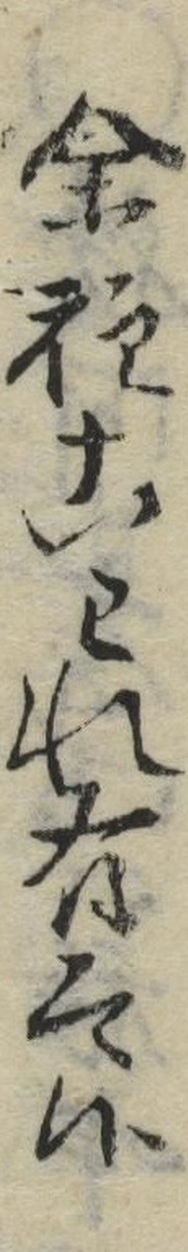余程こわれ有之候
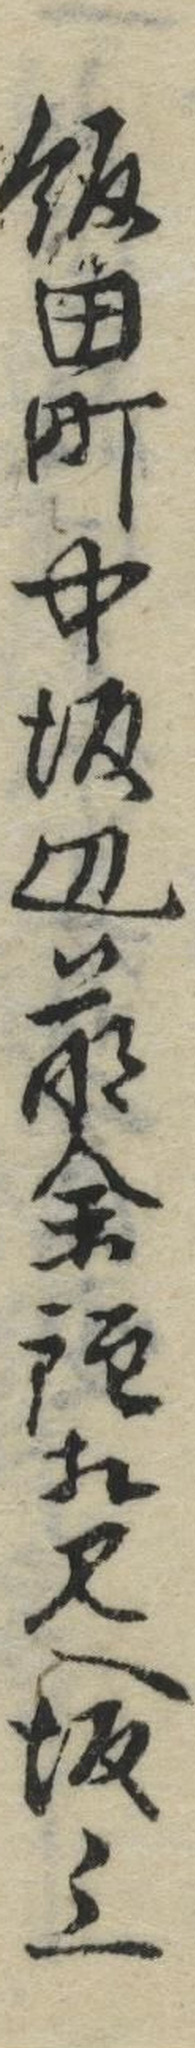飯田町中坂辺前余程相見へ坂ノ上
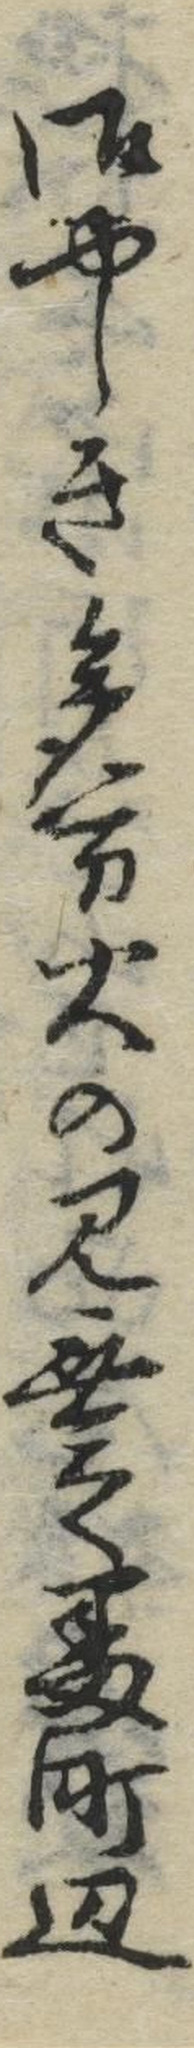御やしき多分火の見無之番町辺
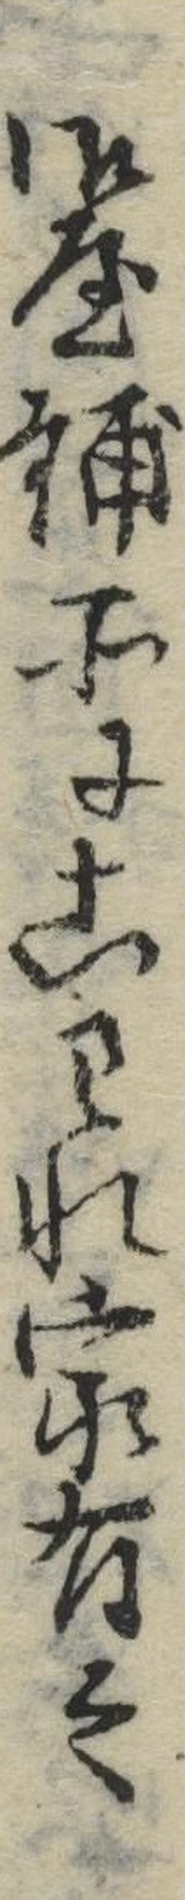御屋舗所にこわれ家有之
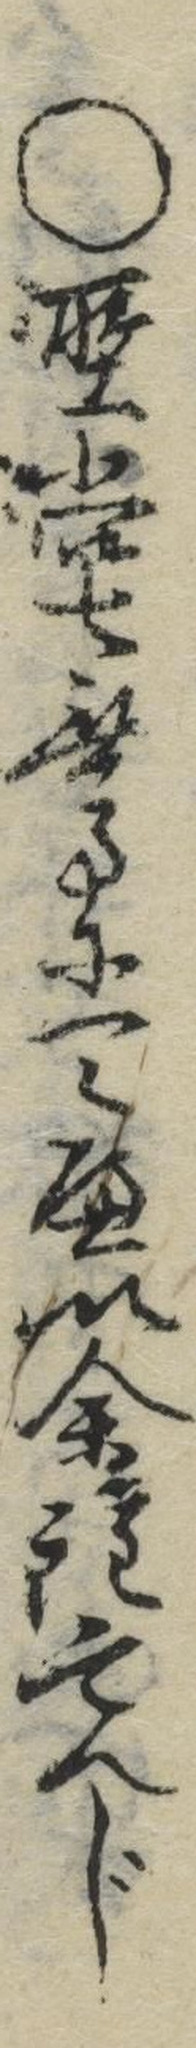〇聖堂無事にてへい余程そんじ
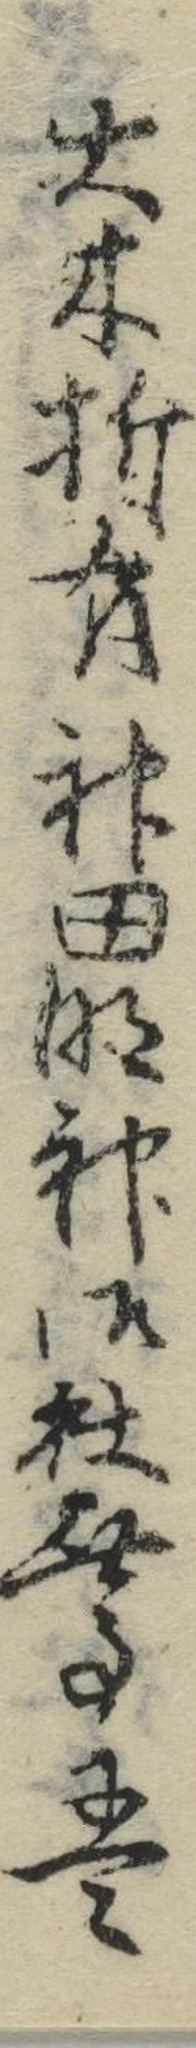大木折有神田明神御社無事にて
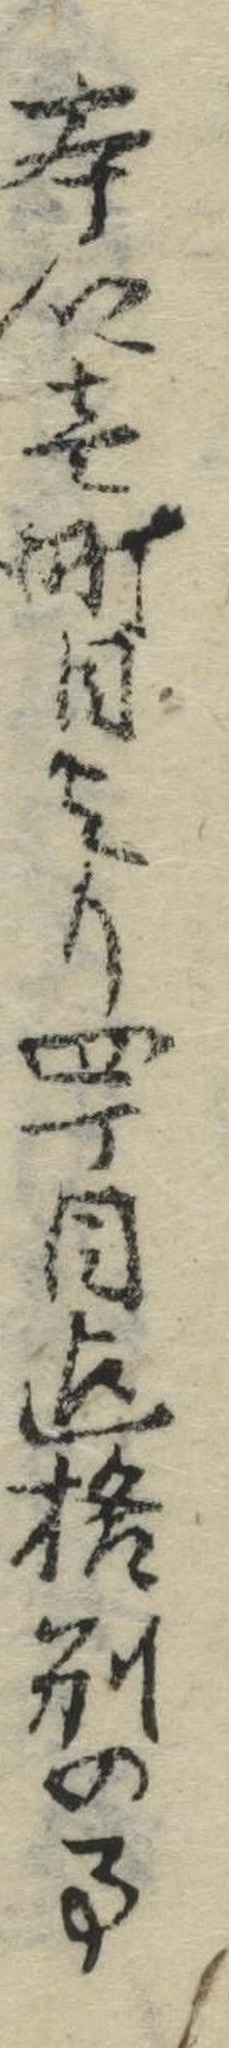本郷壱町目より四丁目迄格別の事
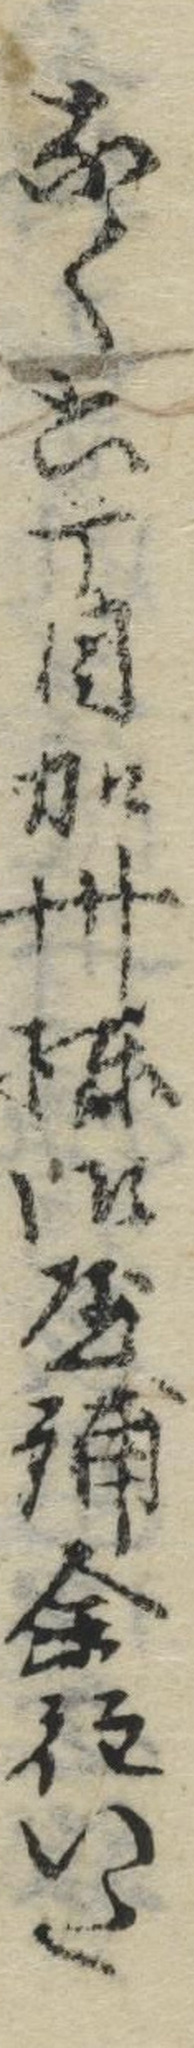なく六丁目加州様御屋舗余程いた
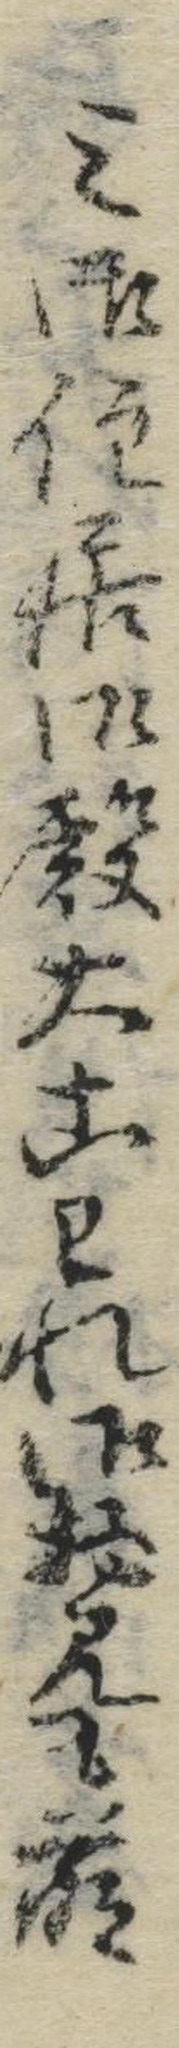ミ御住居御殿大こわれ御物見も崩
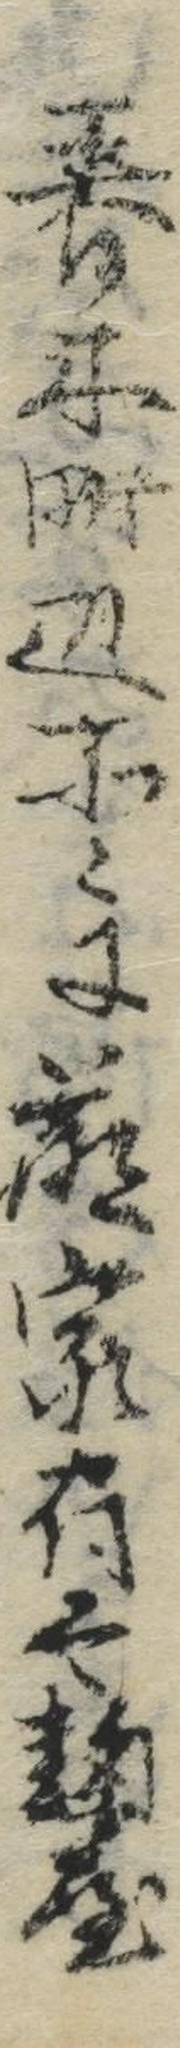春木町辺所〻に崩家有之麹屋
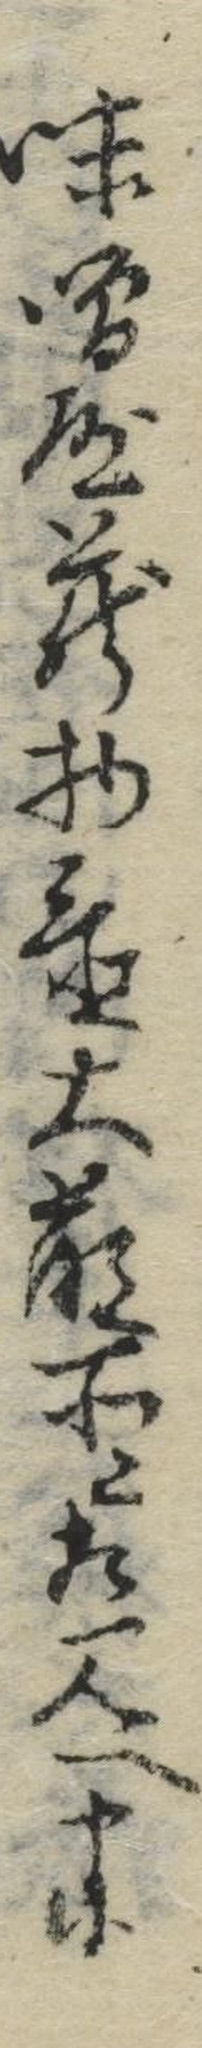味噌屋蔵物置大崩所〻ニ相見へ申候
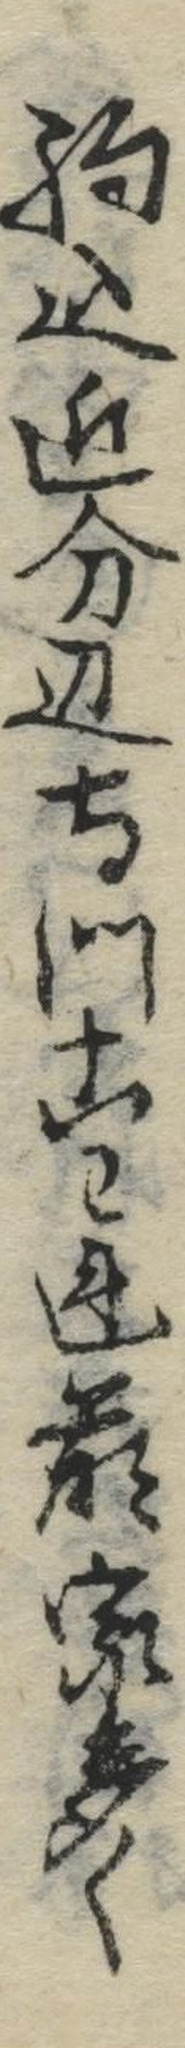駒込近分邊寺門こわれ崩家多く
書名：安政三年辰八月廿五日夜　大江都御屋敷方寺社市中共　大嵐水入場所明細書之寫　并街道筋近郷聞書
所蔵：東京大学地震研究所図書室 Earthquake Research Institute Library, The University of Tokyo, JAPAN
